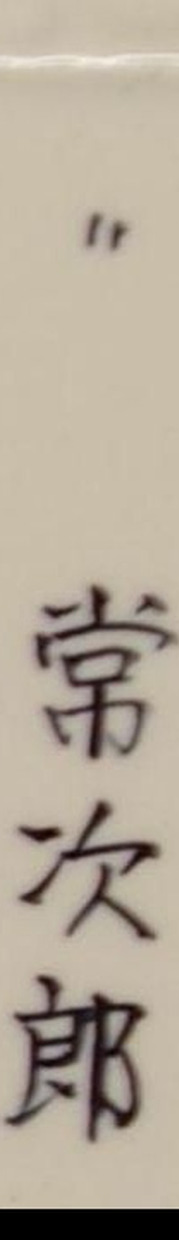常次郎
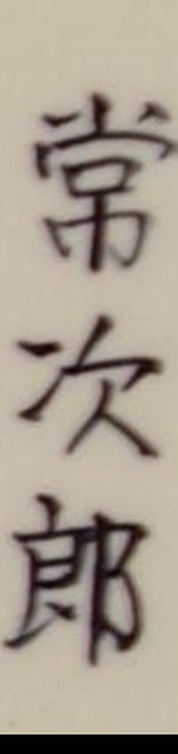常次郎
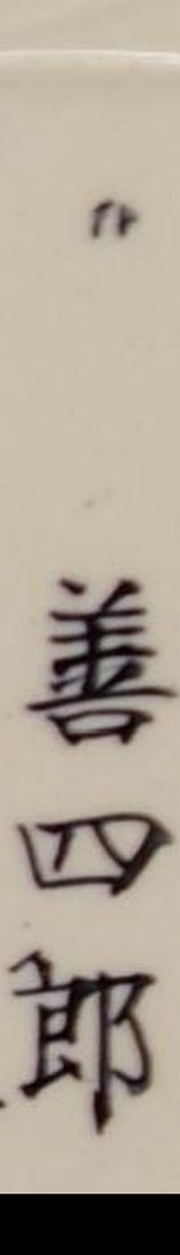善四郎
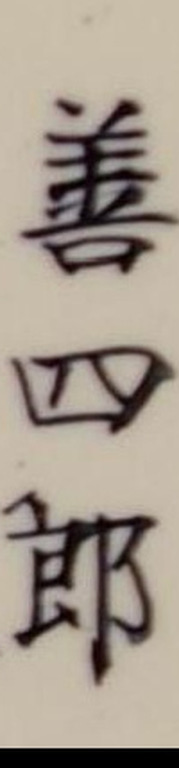善四郎
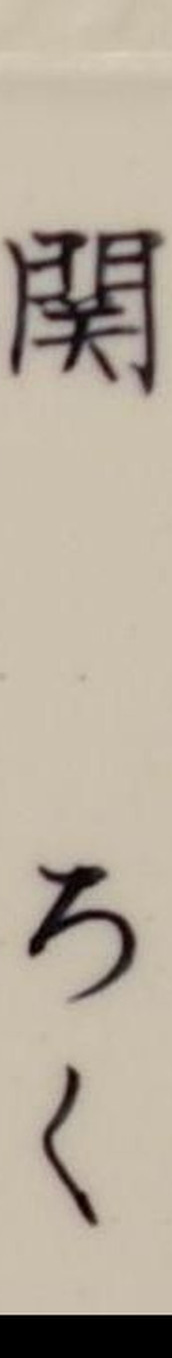関ろく
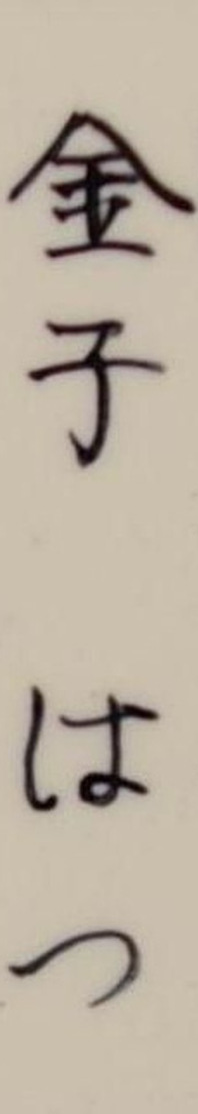金子はつ
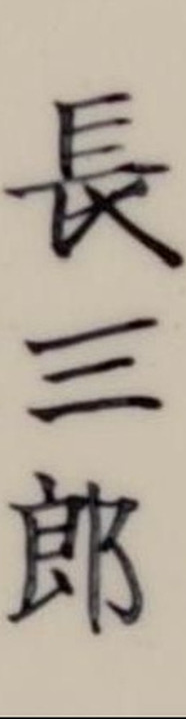長三郎
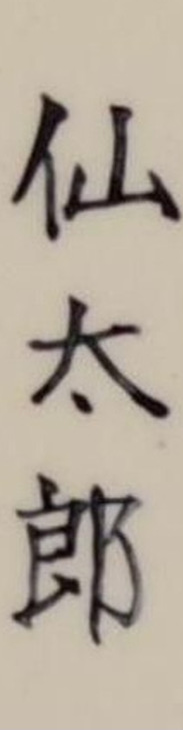仙太郎
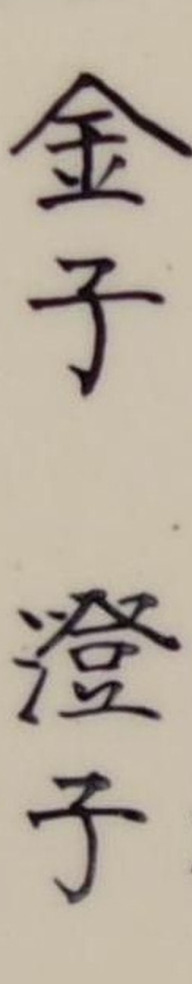金子澄子
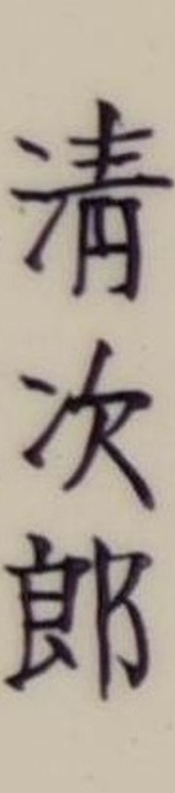清次郎
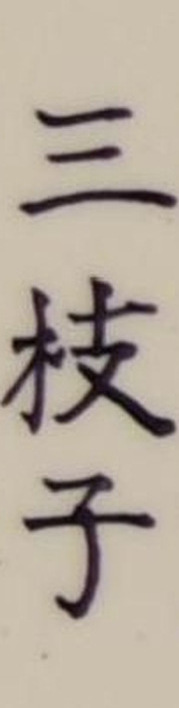三枝子

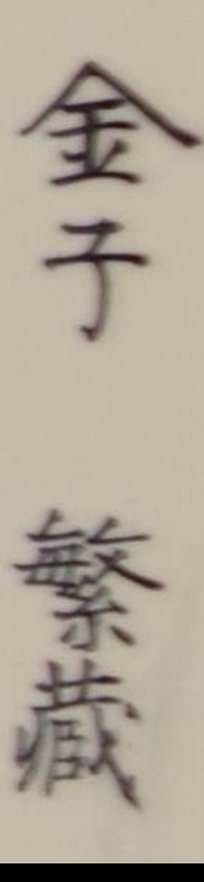金子繁蔵
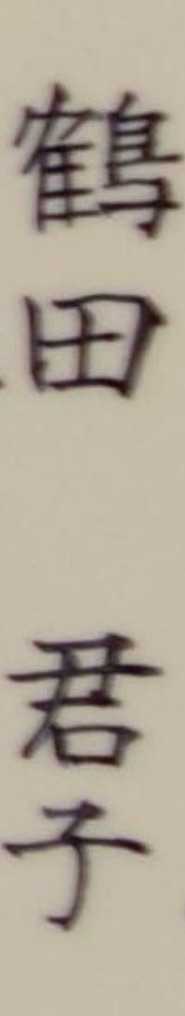鶴田君子
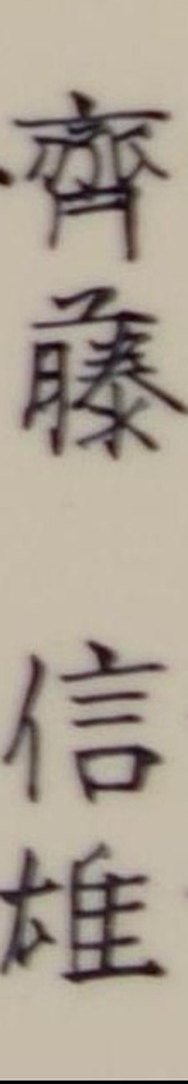斉藤信雄
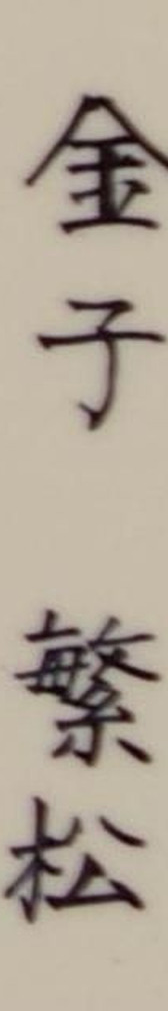金子繁松
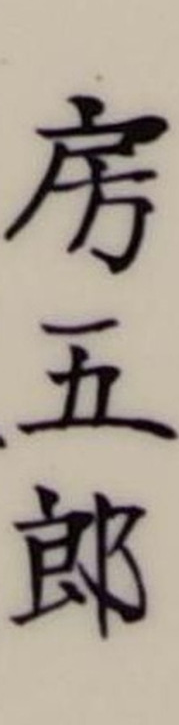房五郎
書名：M~S
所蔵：高野山金剛峯寺
